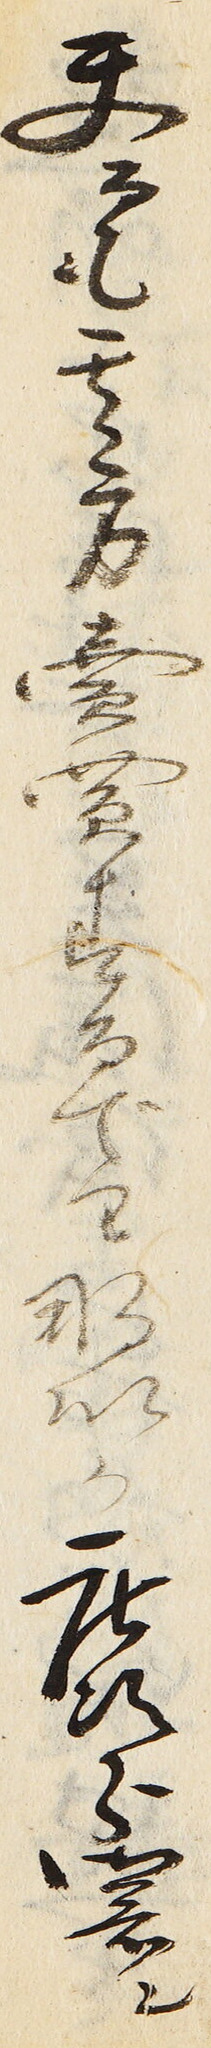夫而も其方売買するでわないか庄次郎御答に
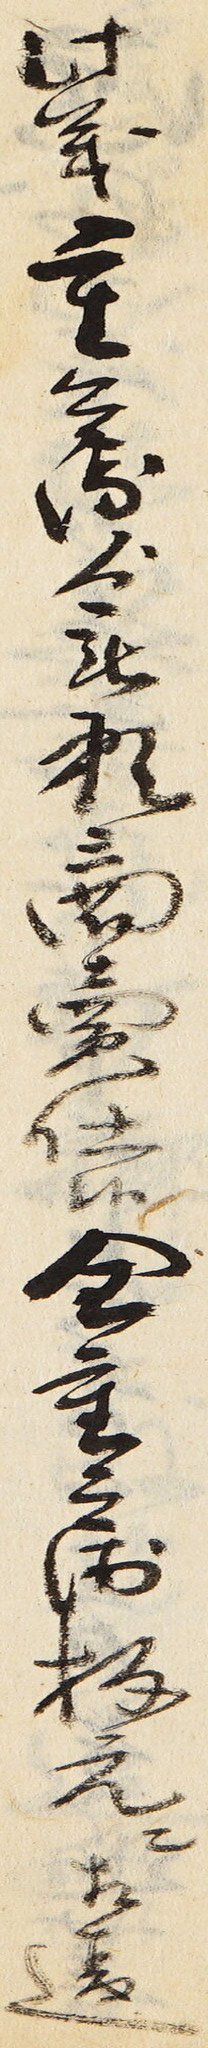此義重兵衛ゟ被頼商売仕候全重兵衛板元に相違
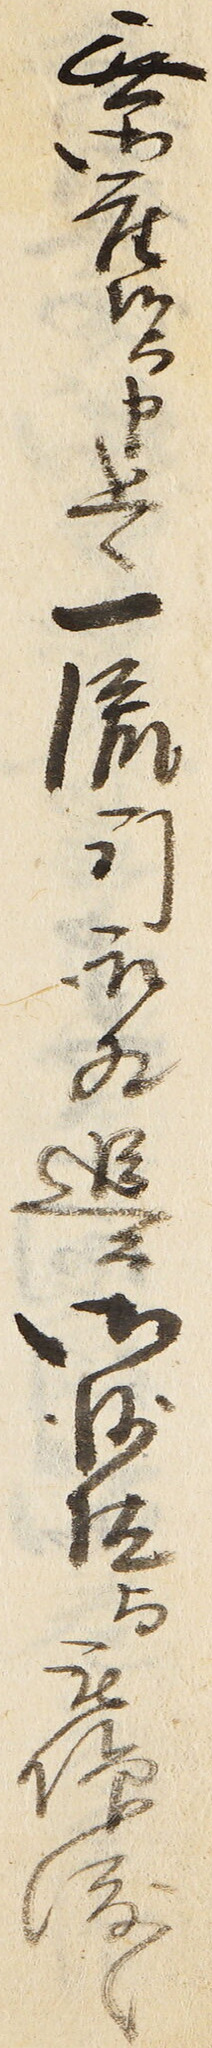無御座候と申上候一統引取為追而御沙汰と被仰渡候
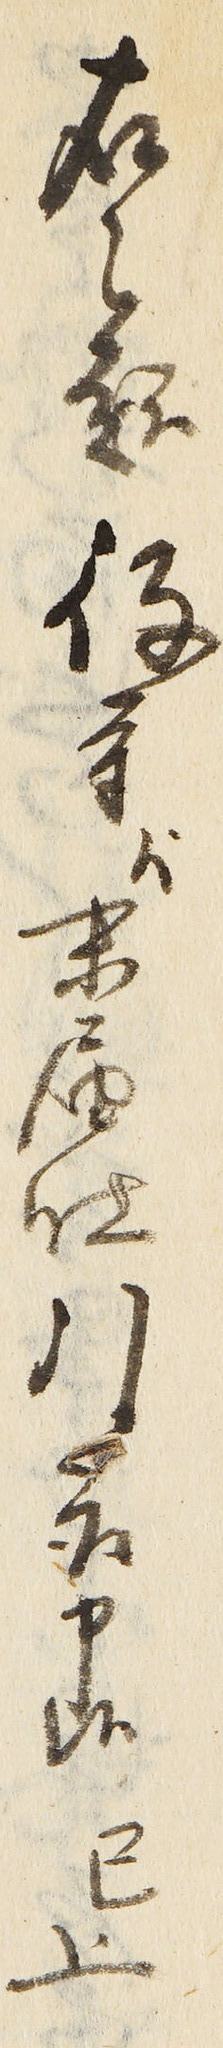右之趣役寺江末届仕引取申候已上
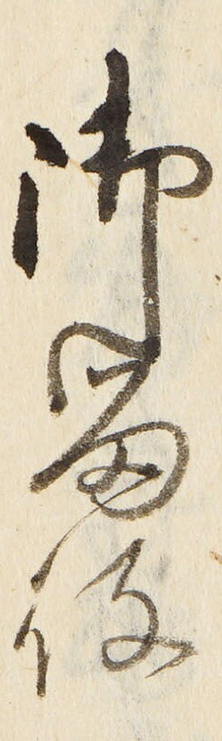御留役
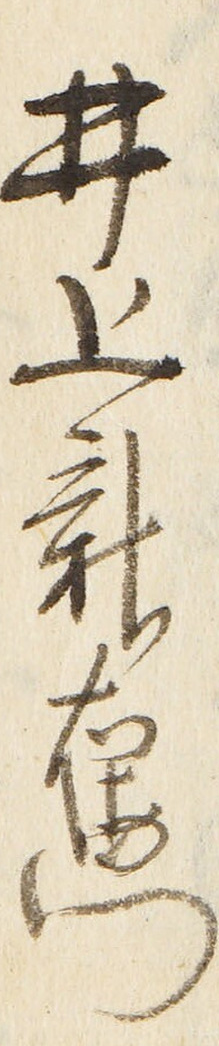井上新右衛門

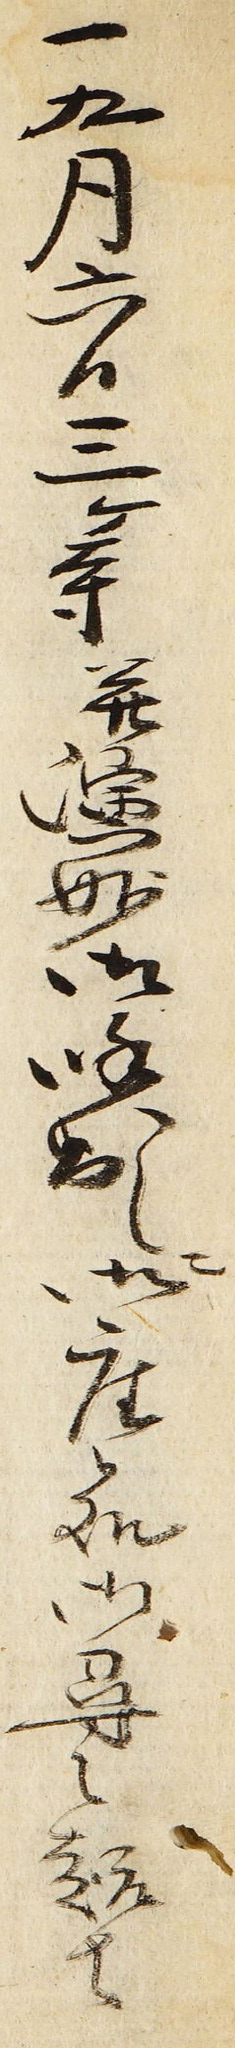一九月六日三ケ寺并演妙御呼出しに御座候処御尋之趣は
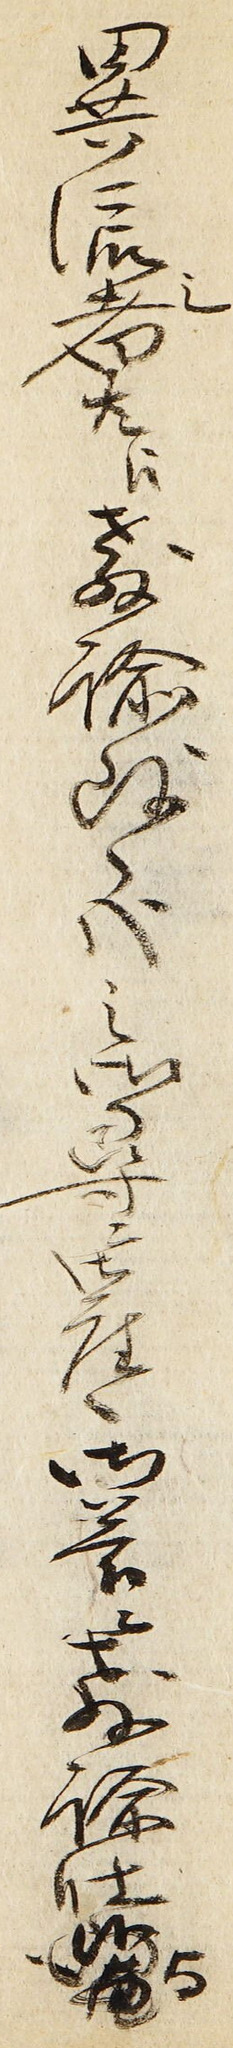異流之者共江教諭致候哉之御尋に御座候御答に教諭仕候と
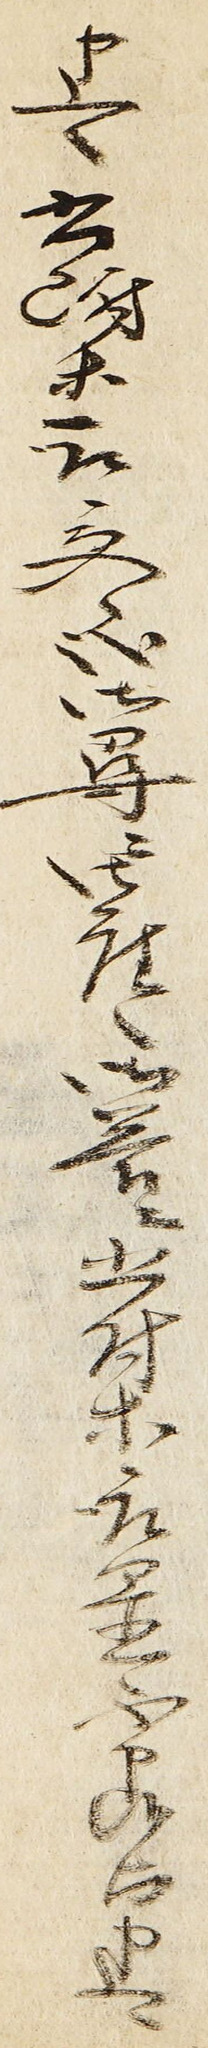申上候書附等取受候哉御尋に御座候御答に書付等取置不申候と申上候
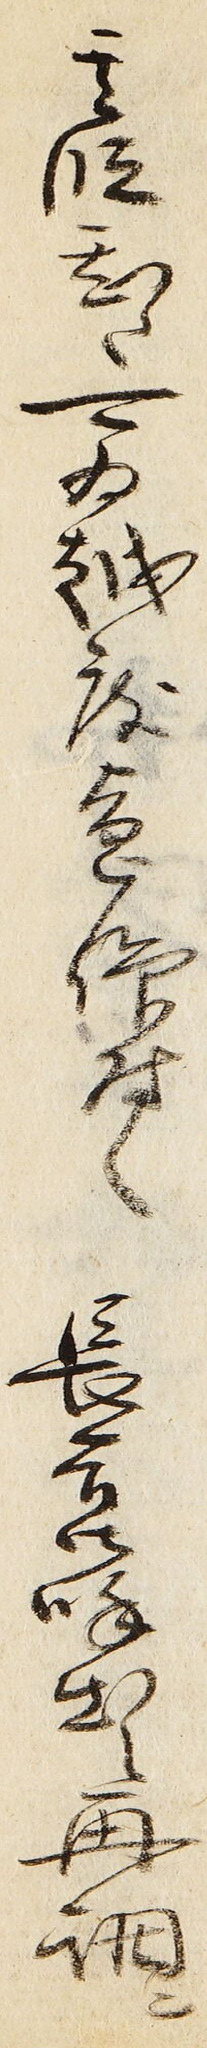其段甚た可為越度旨被仰付候長吉御呼出し再調に
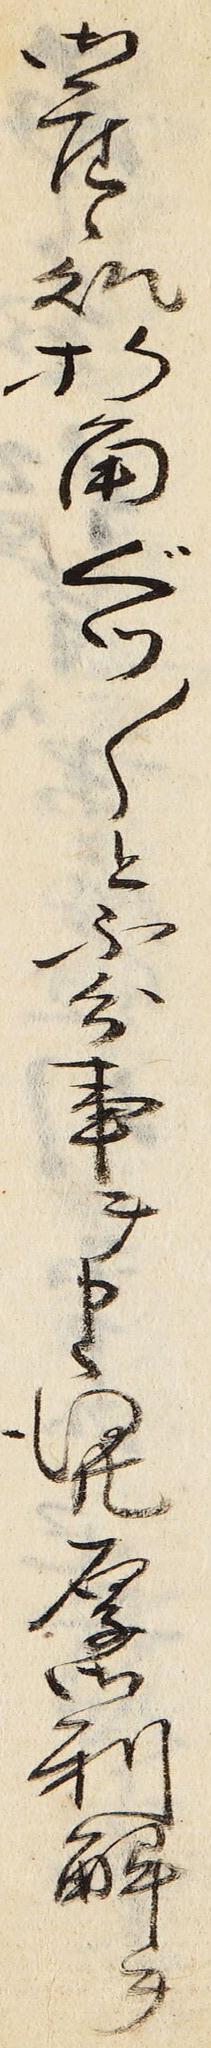御座候処折角ぐつ〳〵と不分事ヲ申候得共厚御利解ヲ
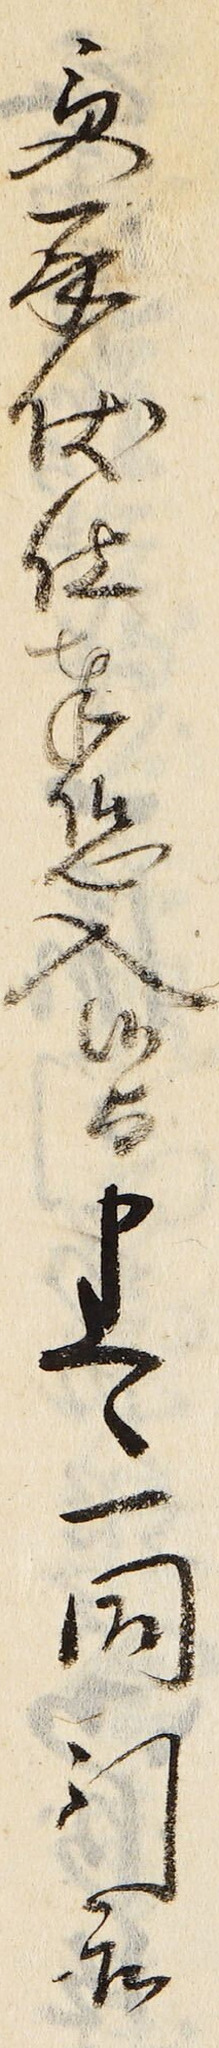受承伏仕奉恐入候と申上候一同引取
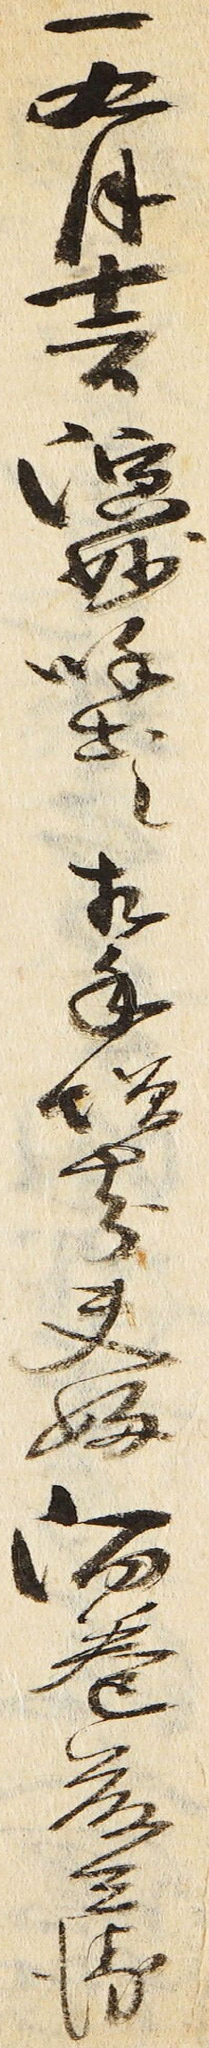一九月十二日演妙呼出し相手増十郎夫婦酒巻藤兵衛
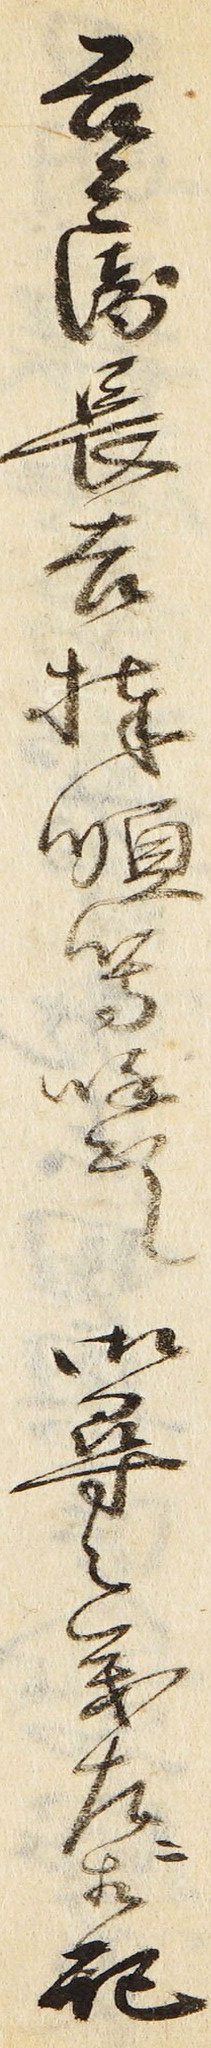吉兵衛長吉捧順等呼出し御尋之義左に相記
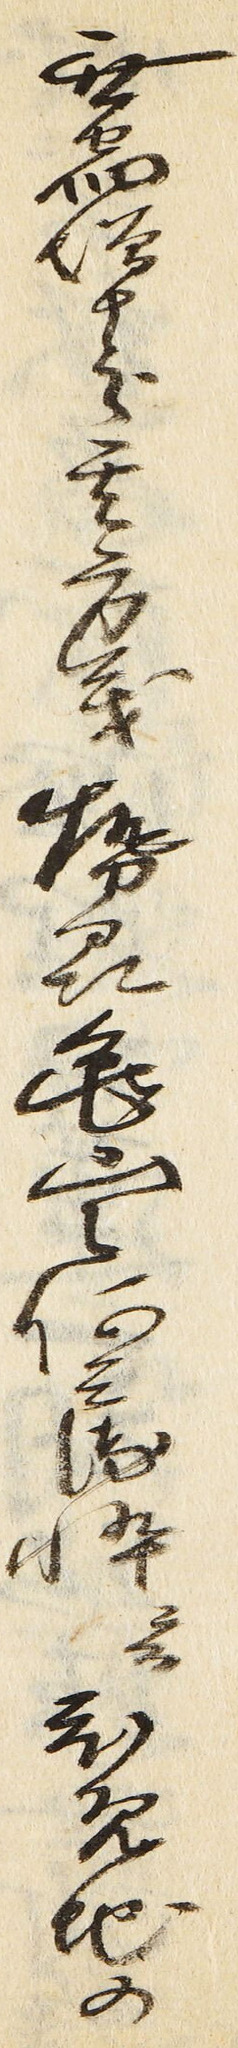無宿増十郎其方義勢州亀山之何兵衛倅に而飛免地の
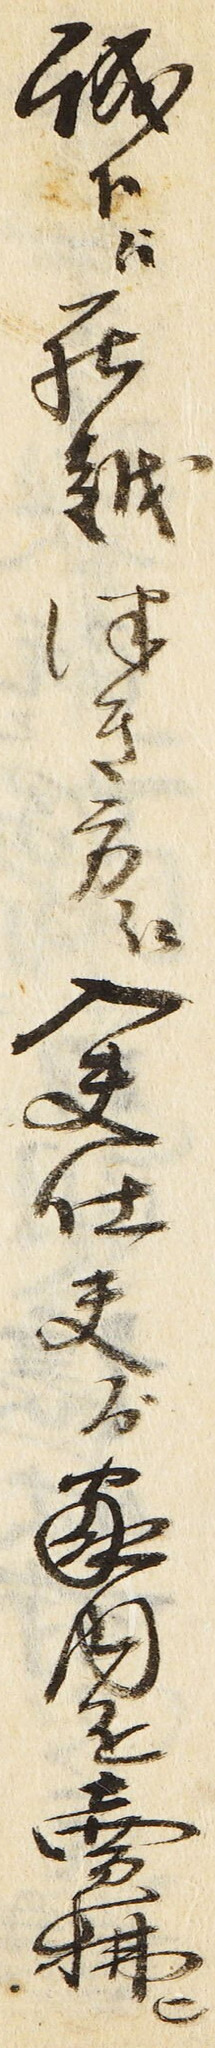城下江罷越つき方江入夫仕夫ゟ家内を売払ひ
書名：異流一件日記
